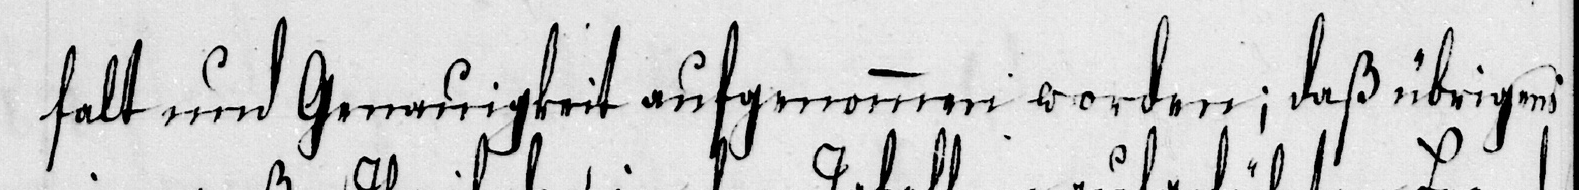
falt und Genauigkeit aufgenommen worden; daß übrigens
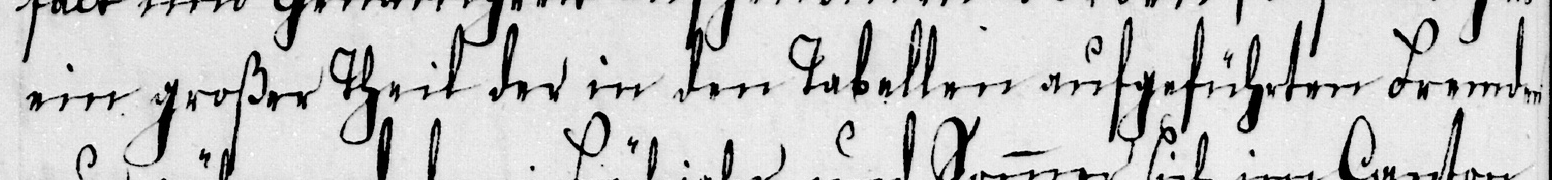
ein großer Theil der in den Tabellen aufgeführten Fremden
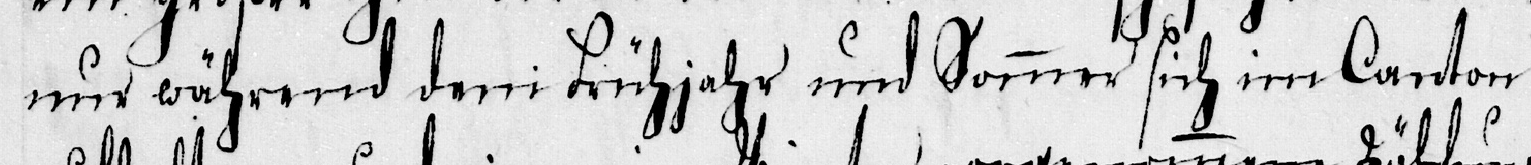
nur während dem Frühjahr und Sommer sich im Canton
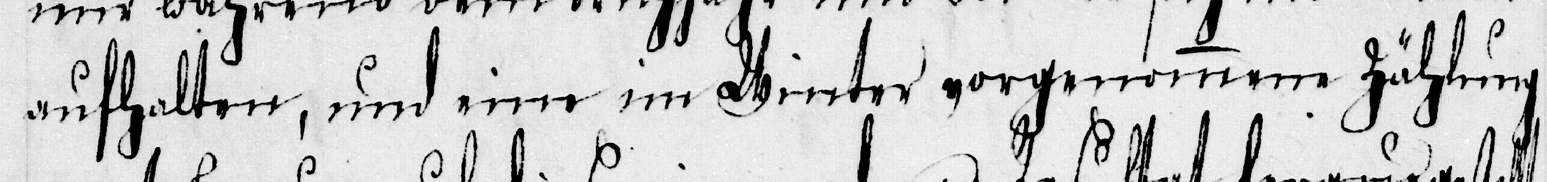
aufhalten, und eine im Winter vorgenommene Zählung
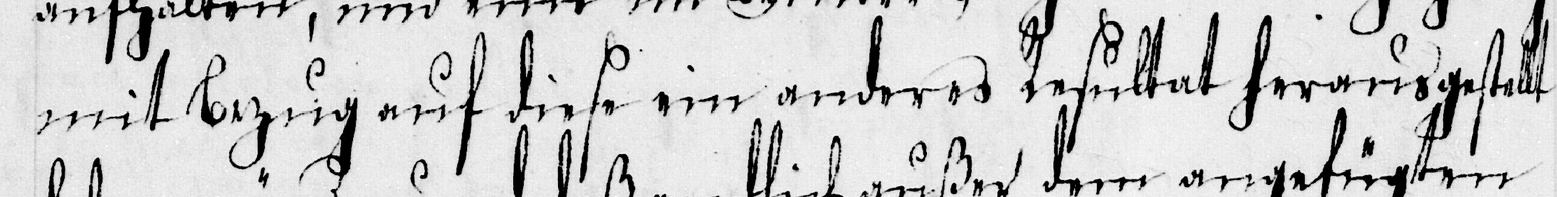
mit Bezug auf diese ein anderes Resultat herausgeste¬
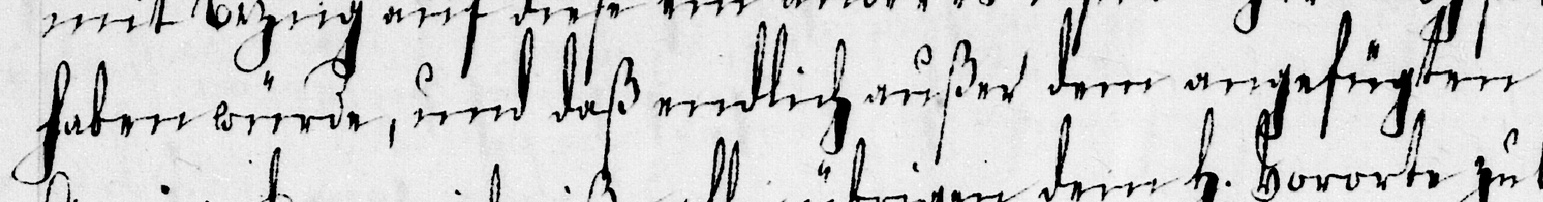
haben würde, und daß endlich außer dem angefügten
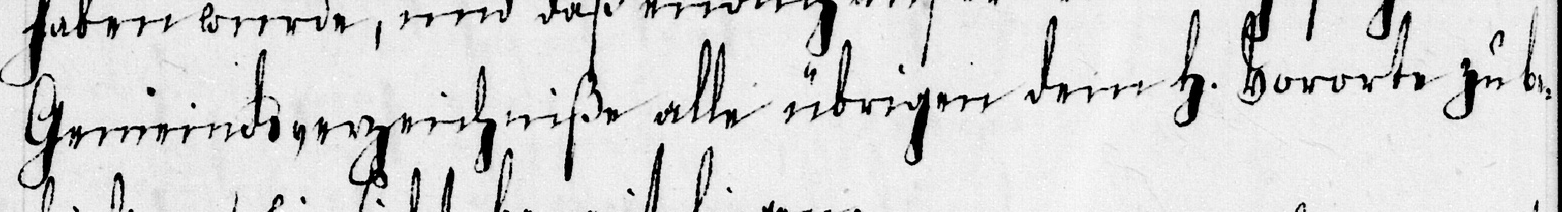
Gemeindsverzeichniße alle übrigen dem H. Vororte zu b¬
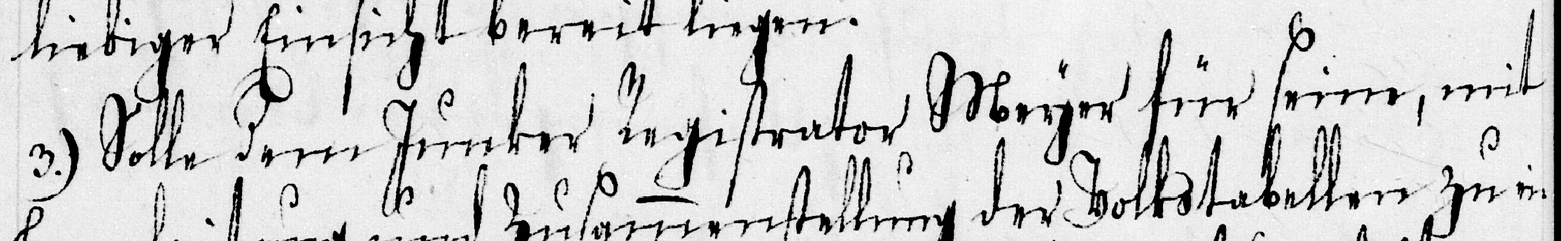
3.) Solle dem Junker Registrator Meyer für seine, mit
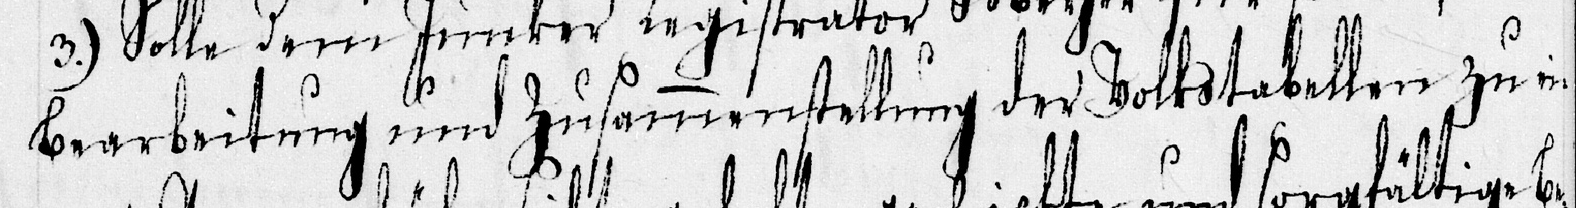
Bearbeitung und Zusammenstellung der Volkstabellen zu e¬
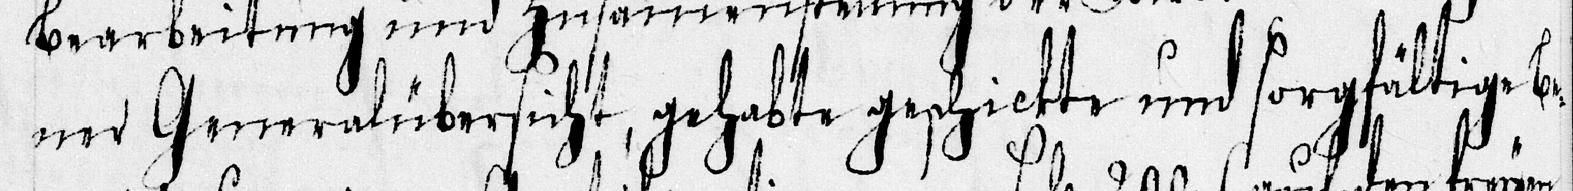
iner Generalübersicht, gehabte geschickte und sorgfältige
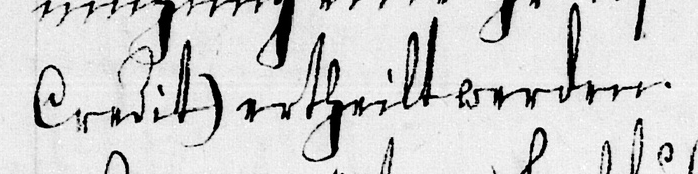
Credit) ertheilt werden.
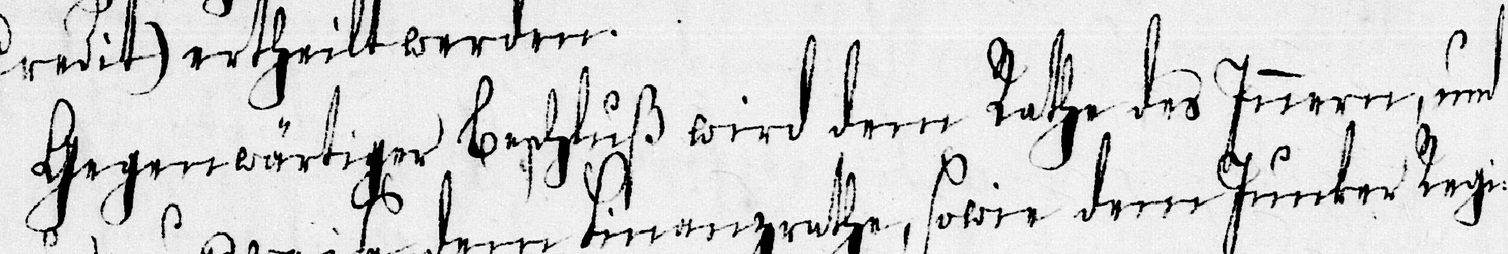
Gegenwärtiger Beschluß wird dem Rathe des Innern, und
